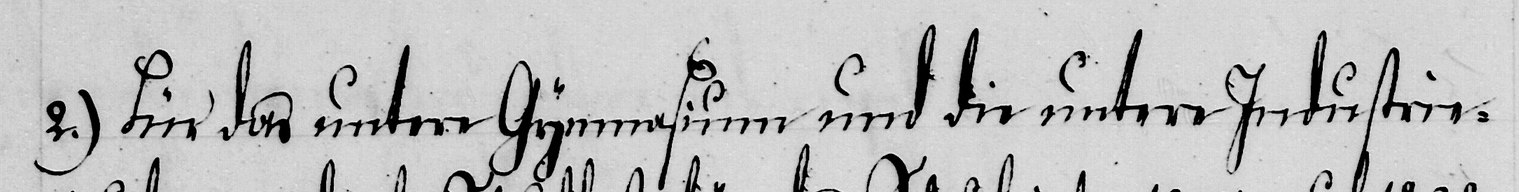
2.) Für das untere Gymnasium und die untere Industrie¬
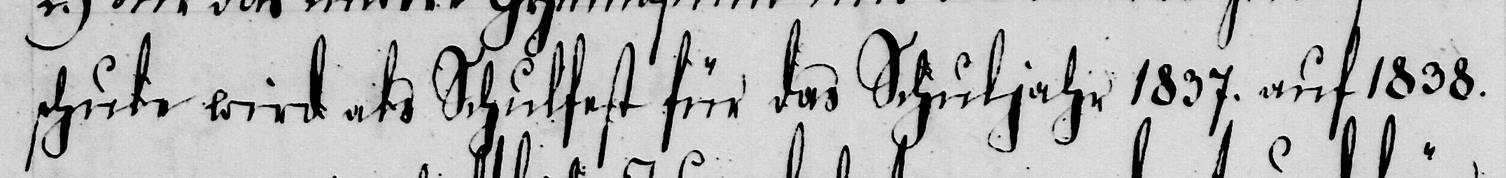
schule wird als Schulfest für das Schuljahr 1837. auf 1838.
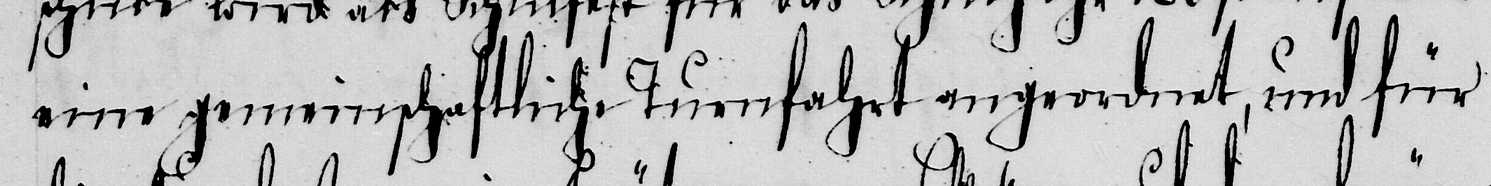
eine gemeinschaftliche Turnfahrt angeordnet, und für
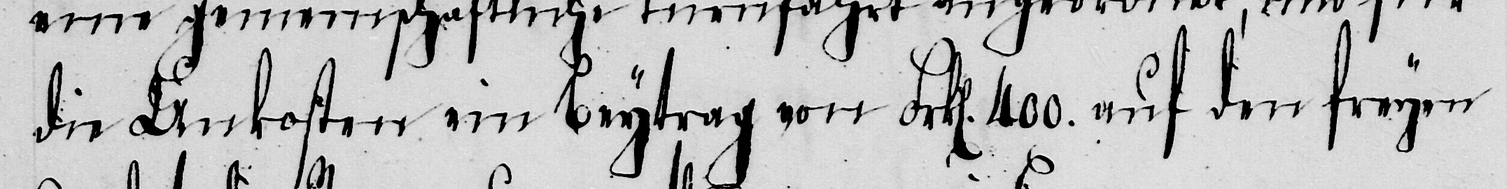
die Unkosten ein Beytrag von Frk[en]. 400. auf den freyen
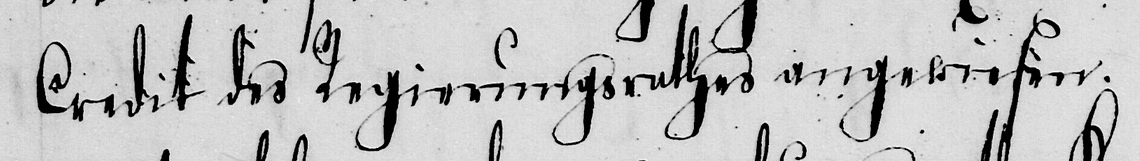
Credit des Regierungsrathes angewiesen.
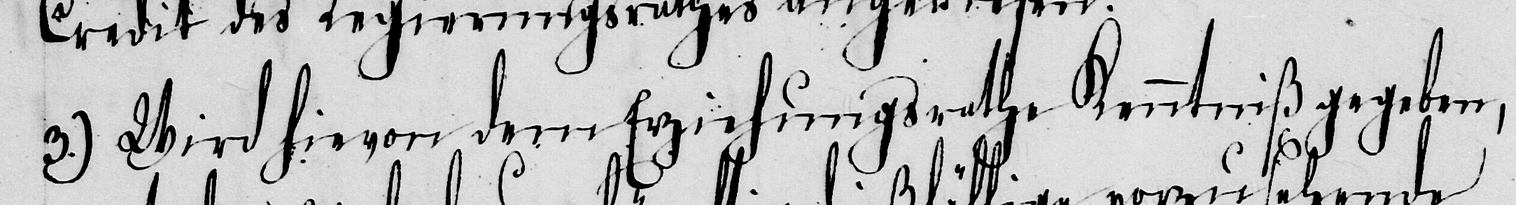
3.) Wird hievon dem Erziehungsrathe Kenntniß gegeben,
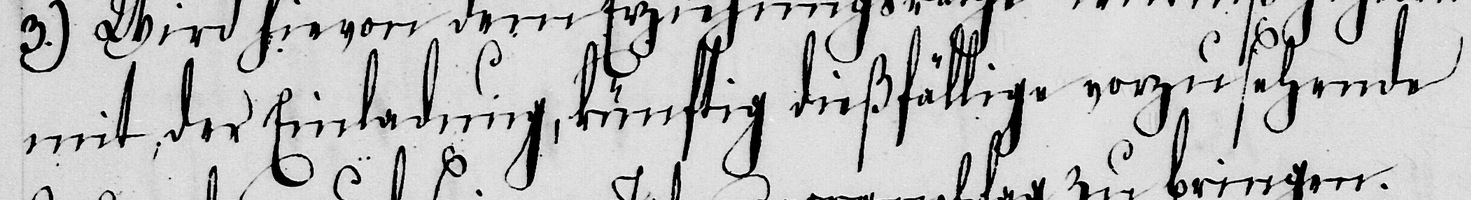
mit der Einladung, künftig dießfällige vorzusehende
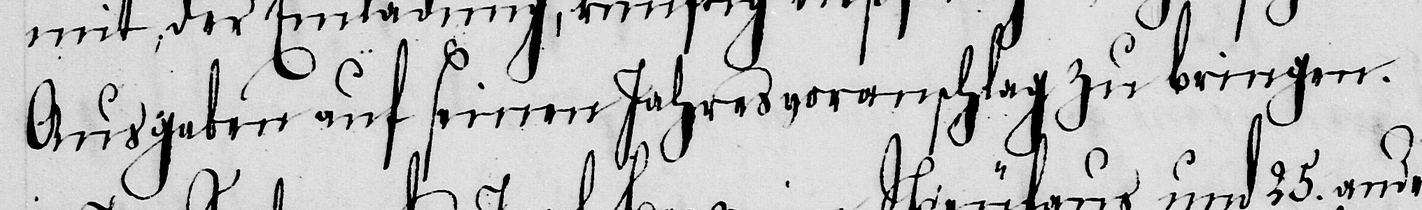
Ausgaben auf seinen Jahresvoranschlag zu bringen.
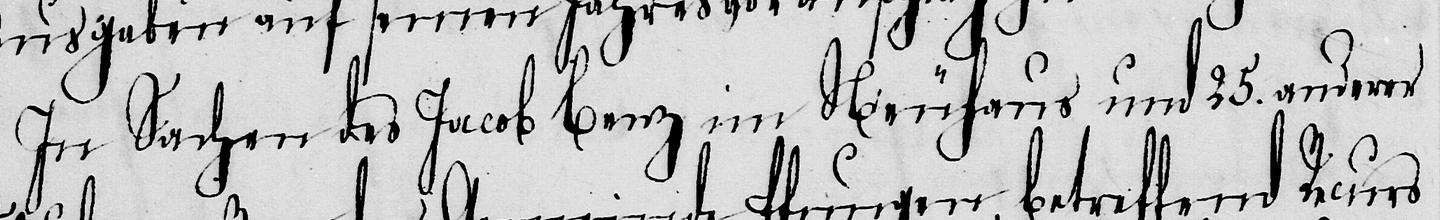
In Sachen des Jacob Benz im Neuhaus und 25. anderer
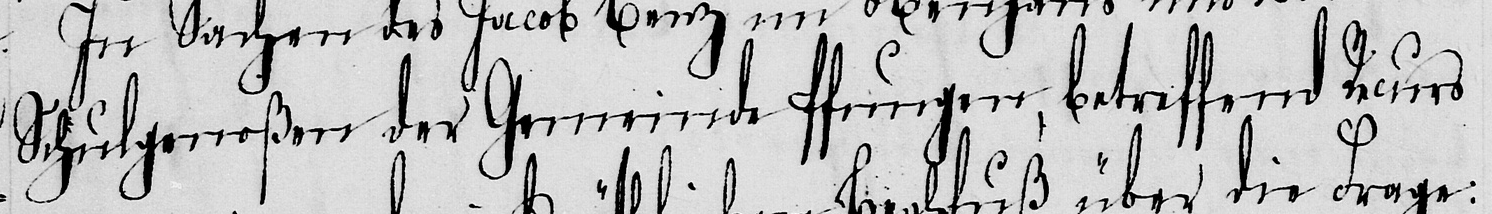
Schulgenoßen der Gemeinde Pfungen, betreffend Recurs
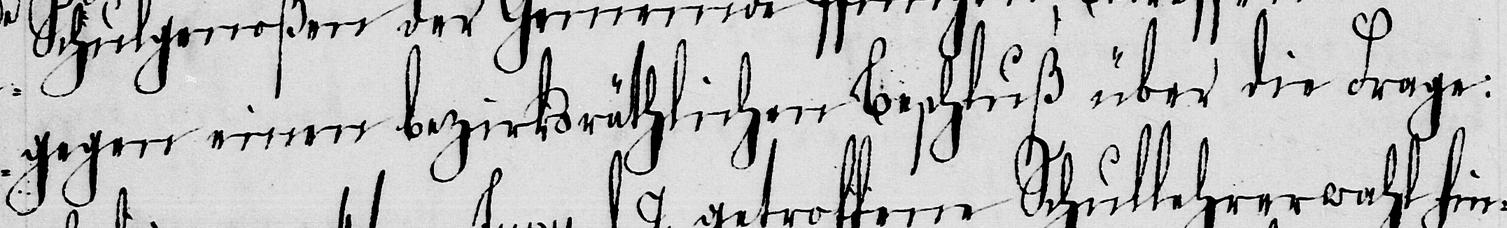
gegen einen bezirksräthlichen Beschluß über die Frage:
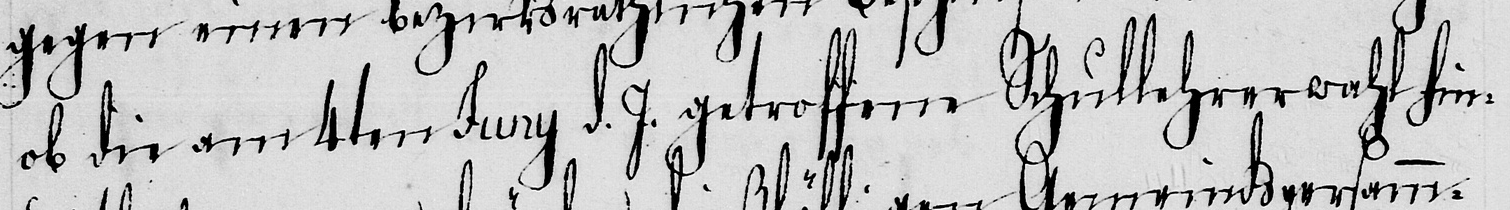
ob die am 4ten Juny d. J. getroffene Schullehrerwahl hi¬
